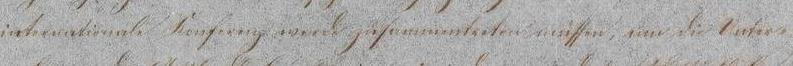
internationale Konferenz werde zusammentreten müssen, um die Unter-
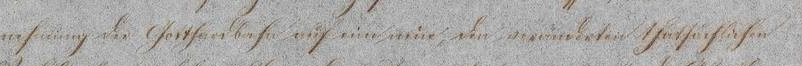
nehmung der Gotthardbahn auf eine neue, den veränderten thatsächlichen
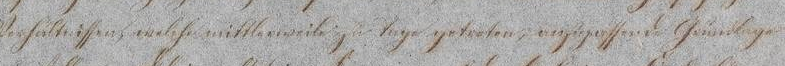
Verhältnissen, welche mittlerweile zu Tage getreten, anzupassende Grundlage
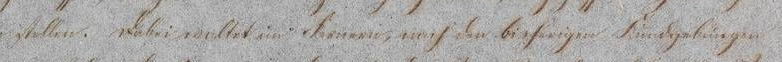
stellen. Dabei waltet im Fernern, nach den bisherigen Kundgebungen
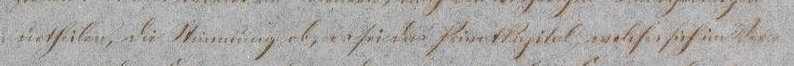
urtheilen, die Meinung ob, es sei das Privatkapital, welches sich im Ver-
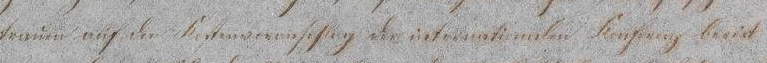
trauen auf den Kostenvoranschlag der internationalen Konferenz bereit
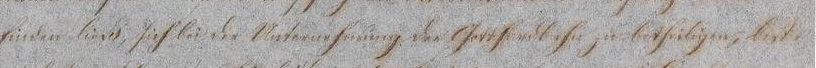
finden ließ, sich bei der Unternehmung der Gotthardbahn zu betheiligen, best-
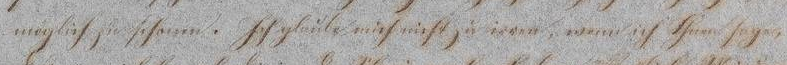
möglich zu schonen. Ich glaube mich nicht zu irren, wenn ich Ihnen sage,
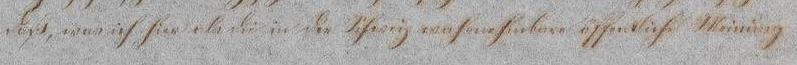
daß, was ich hier als die in der Schweiz wahrnehmbare öffentliche Meinung
